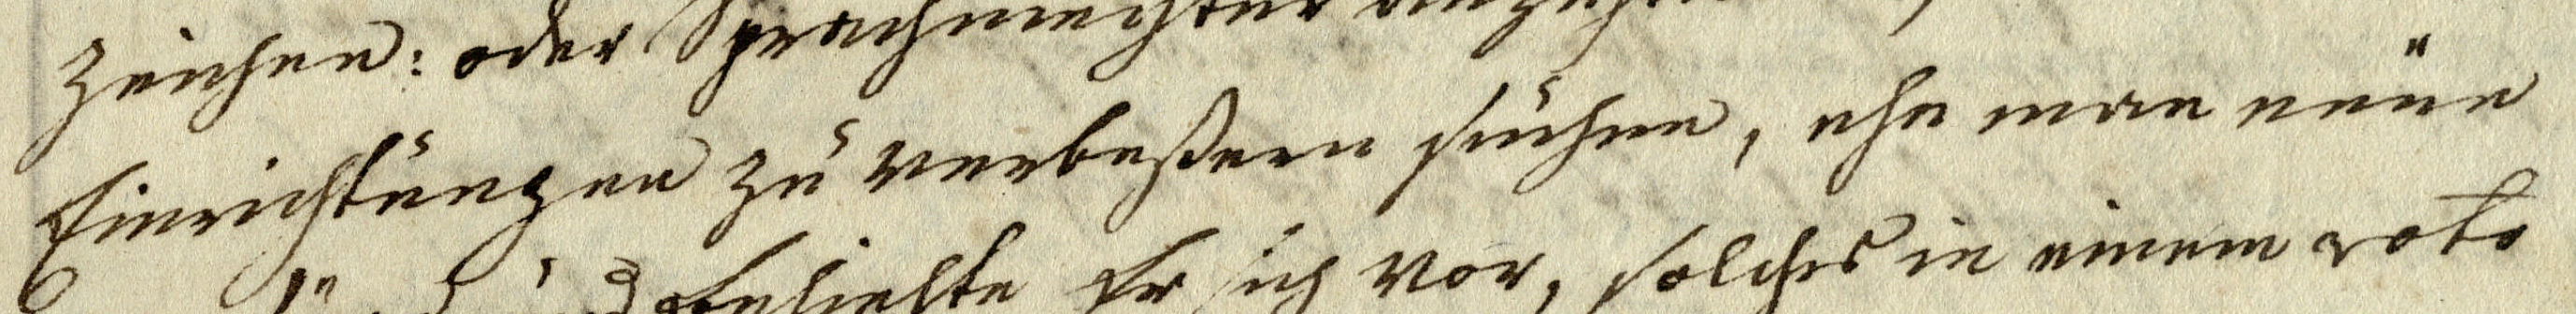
Einrichtungen zu verbeßern suchen, ehe man neue
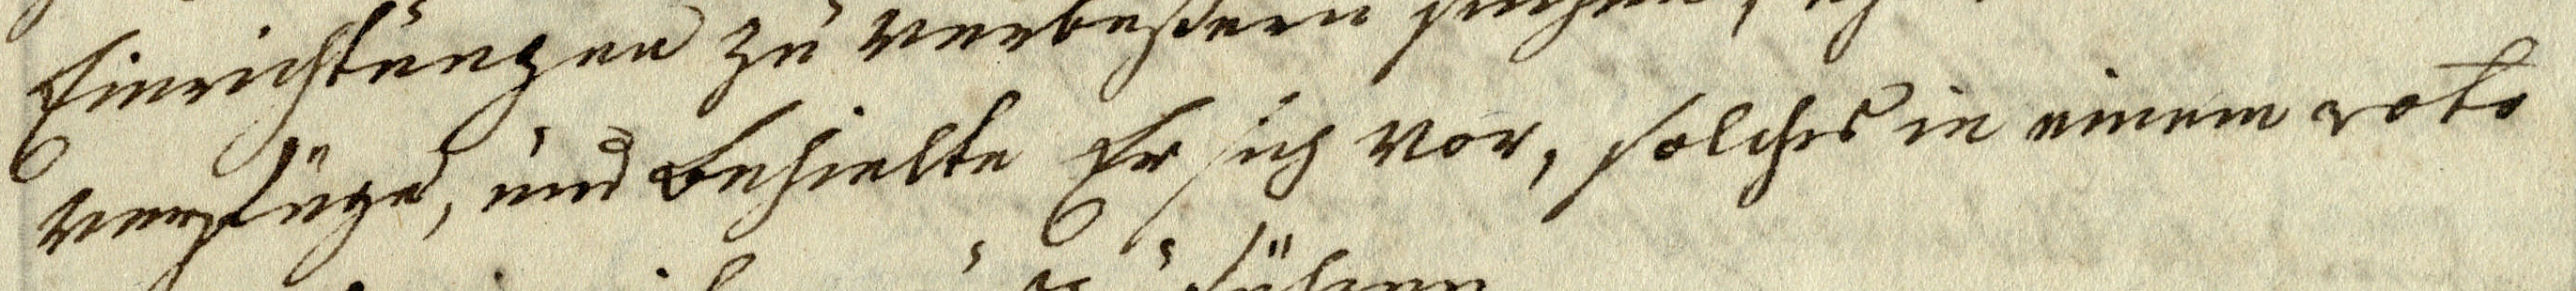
verfüge, und behielte Er sich vor, solches in einem voto
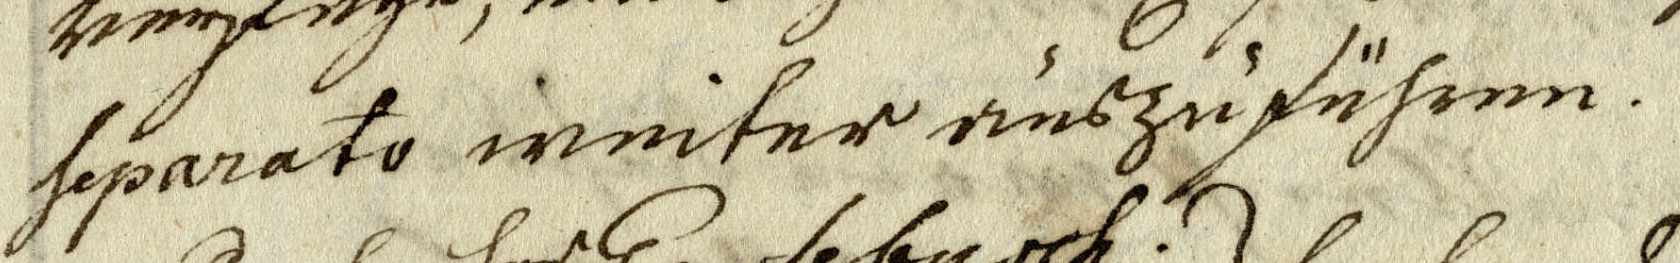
separato weiter auszuführen.
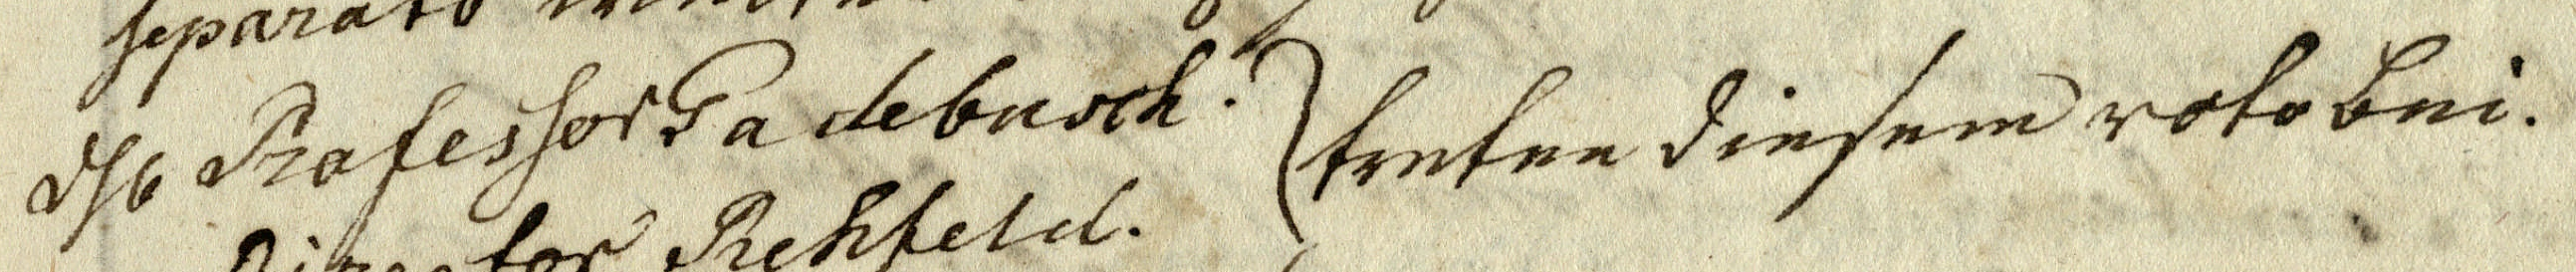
dh Professor Gadebusch. treten diesem voto bei
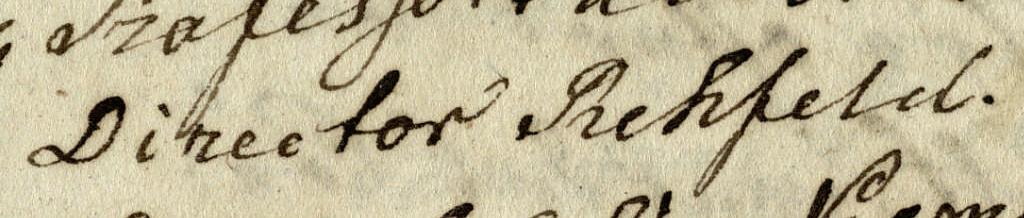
Director Rehfeld.
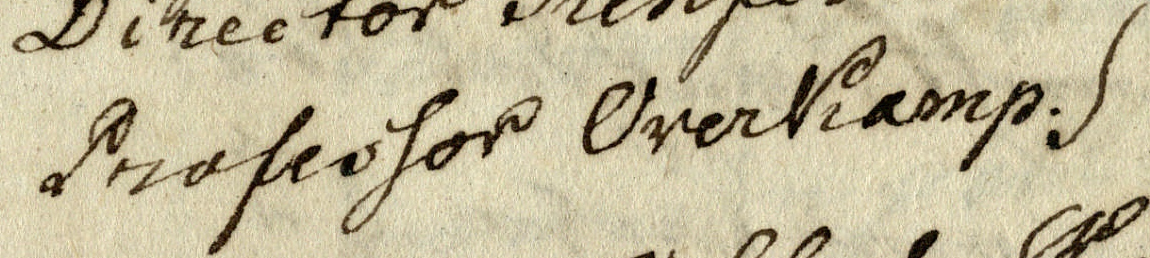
Professor Overkamp.
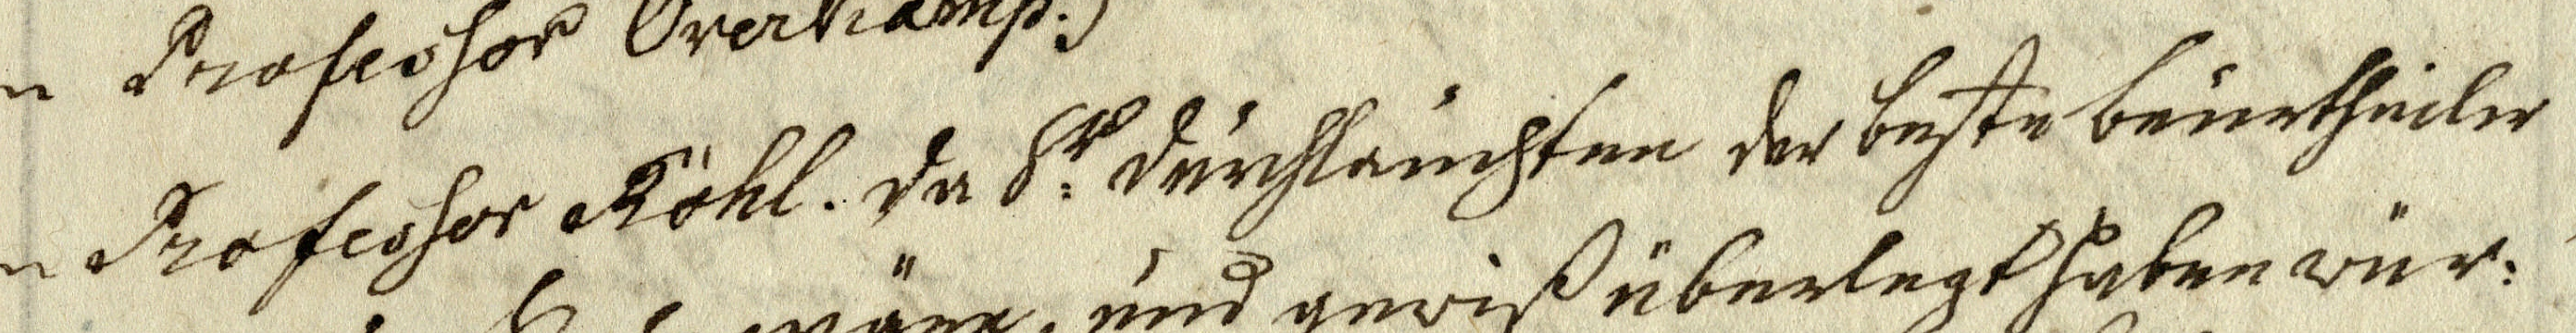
Professor Röhl. Da Sr. Durchlauchten der beste Beurtheiler
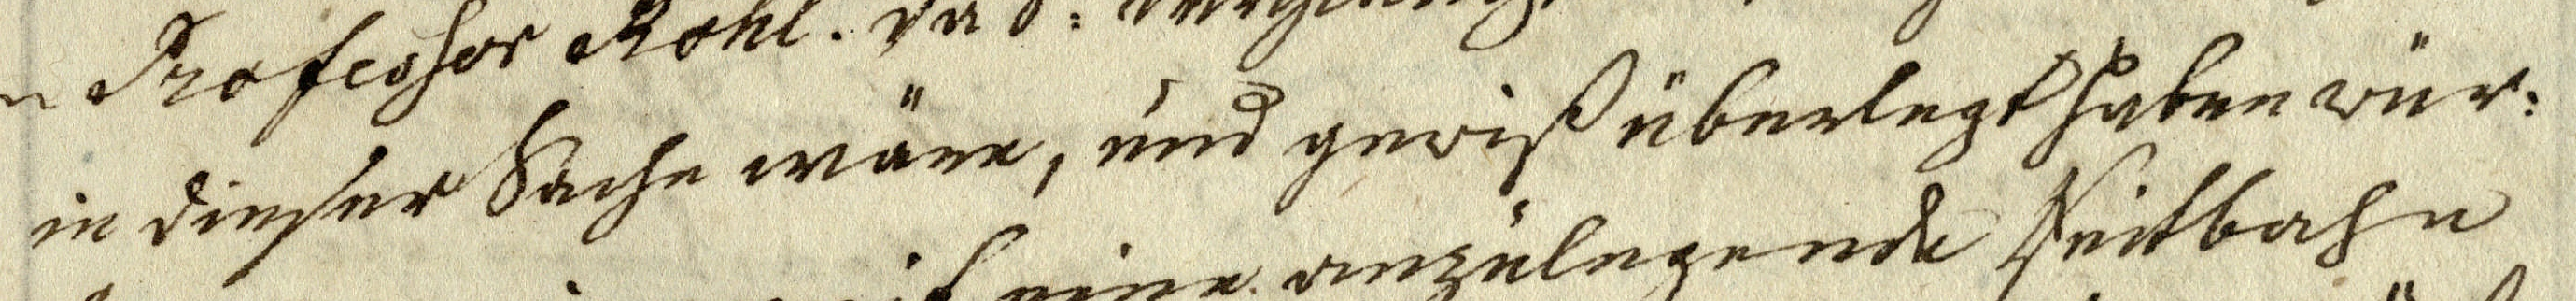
in dieser Sache wäre, und gewiß überlegt haben wür¬
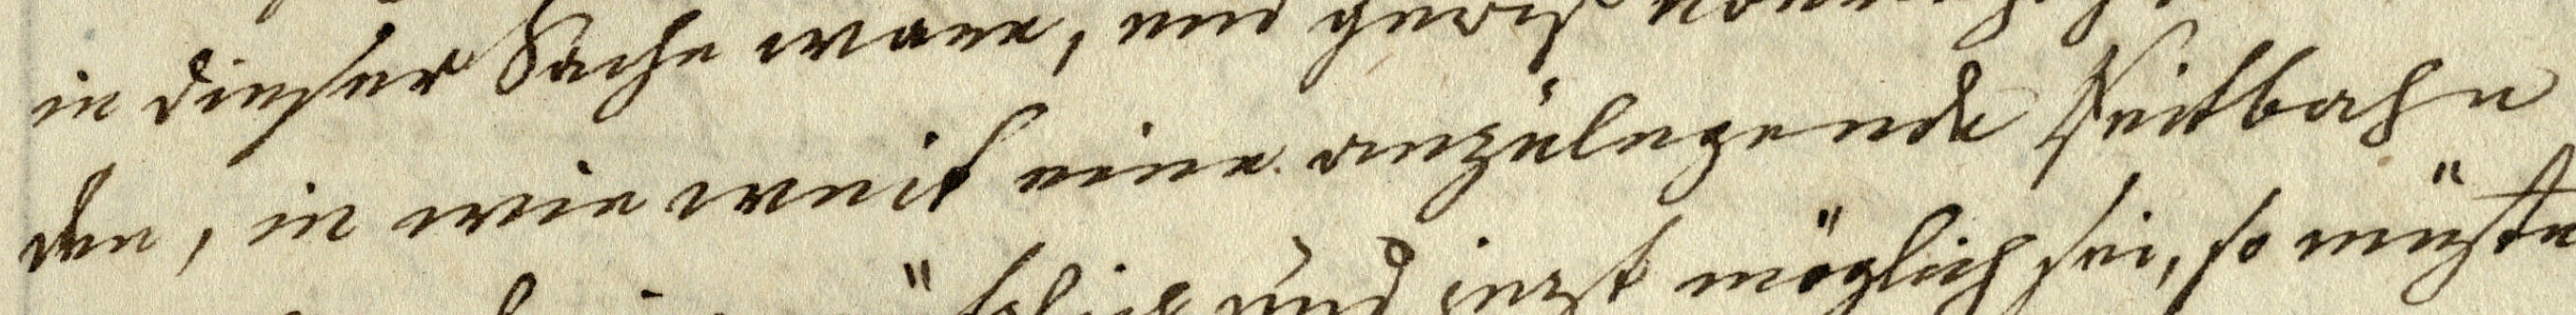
den, in wie weit eine anzulegende Reitbahn
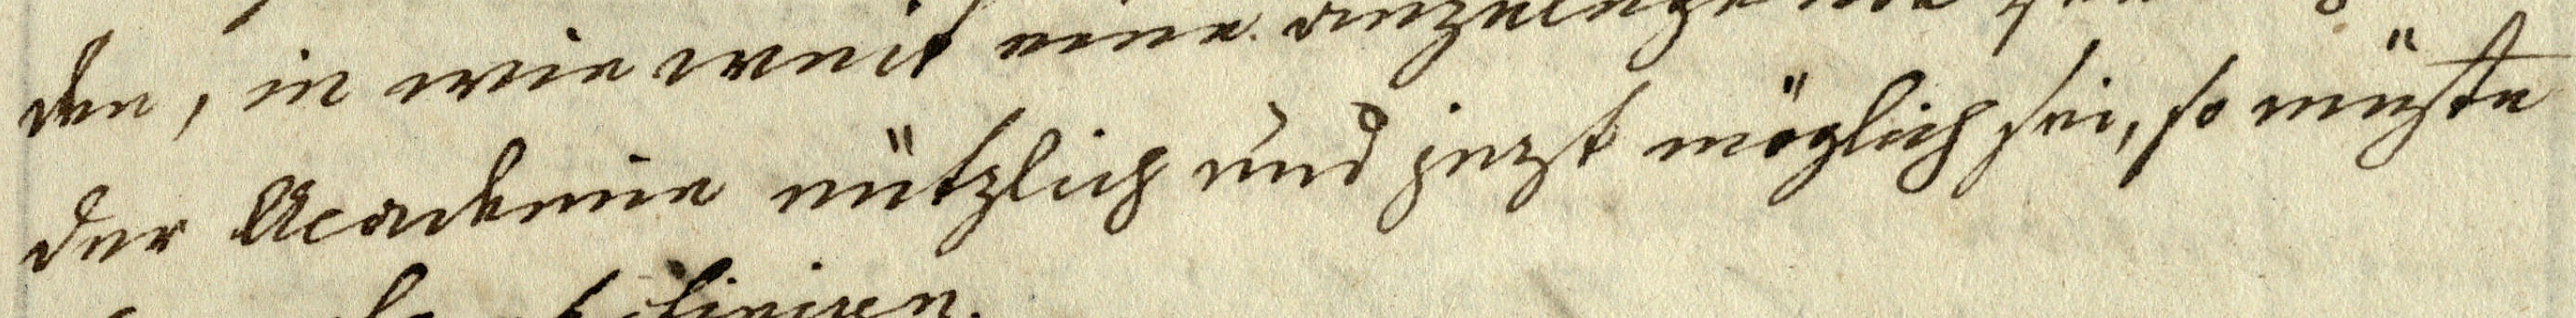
der Academie nützlich und jezt möglich sei, so müste
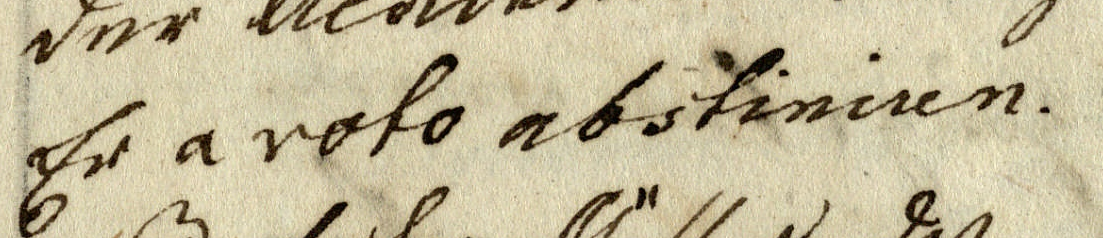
Er a voto abstiniren.
